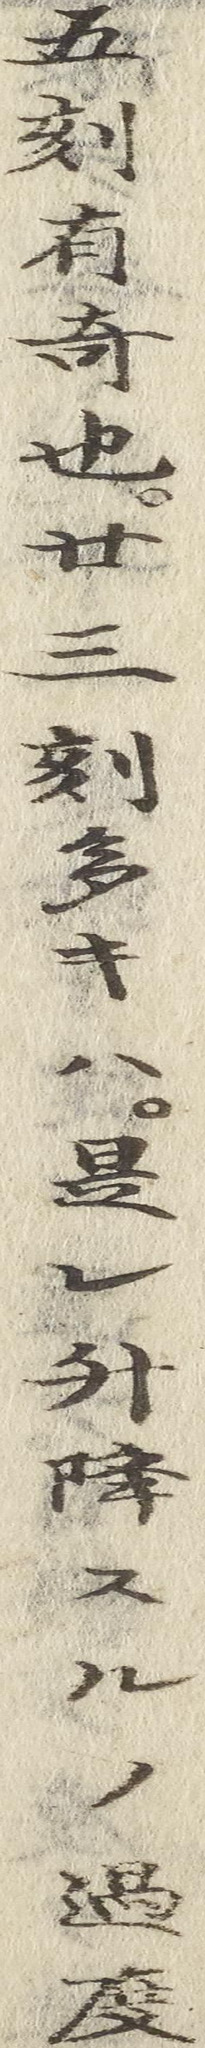五刻有奇也。廿三刻多キハ。是レ升降スルノ過度
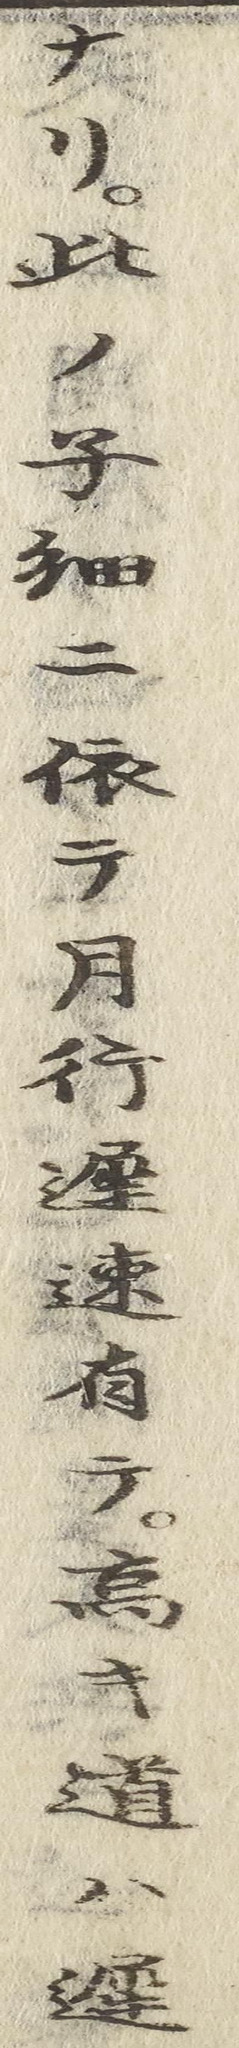ナリ。此ノ子細ニ依テ月行遅速有テ。高キ道ハ遅
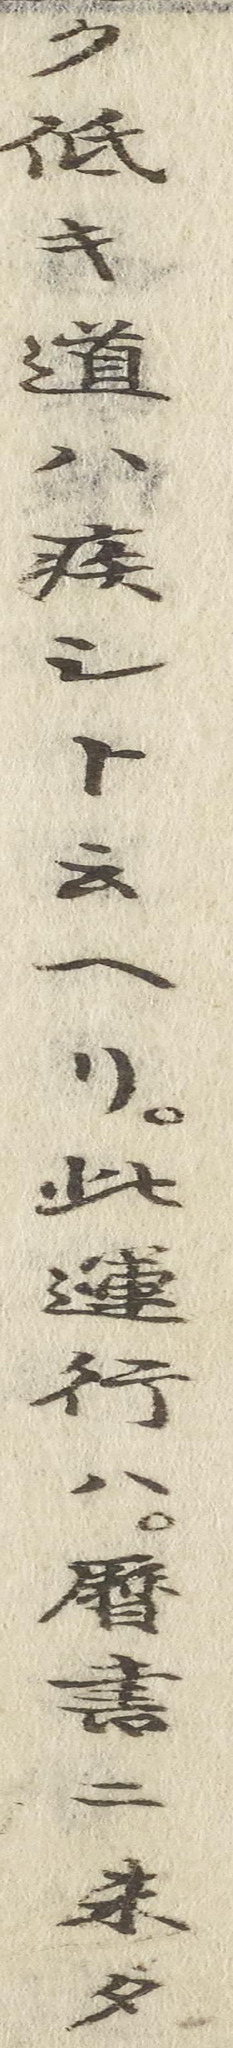ク低キ道ハ疾シト云ヘリ。此運行ハ。暦書ニ未タ
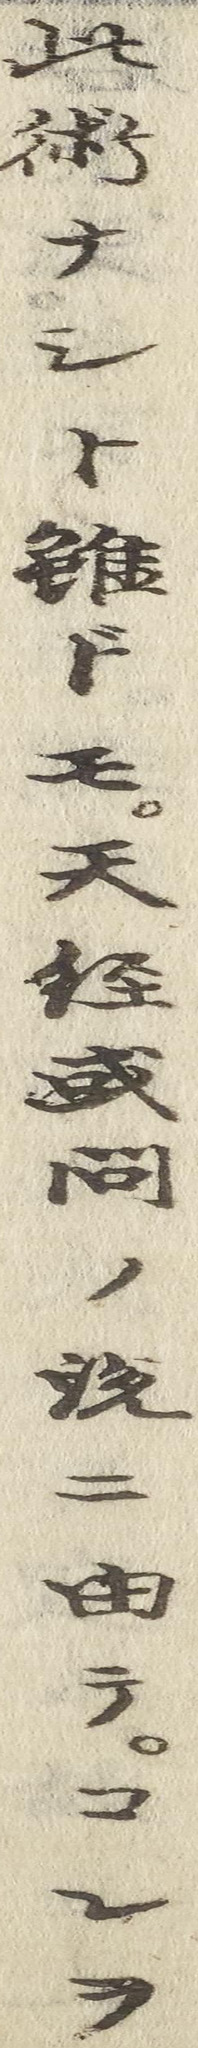此術ナリト雖ドモ。天径或問ノ説ニ由テ。コレヲ
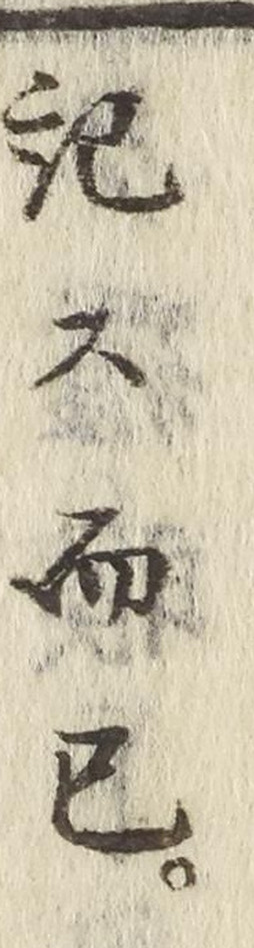記ス而已。
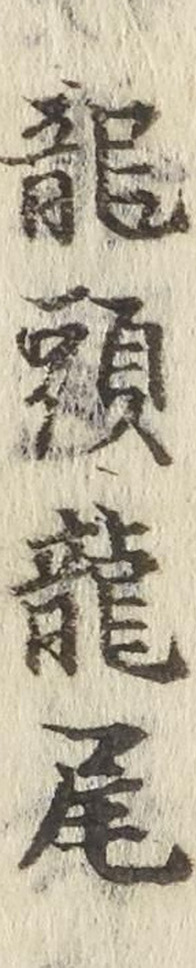竜頭龍尾
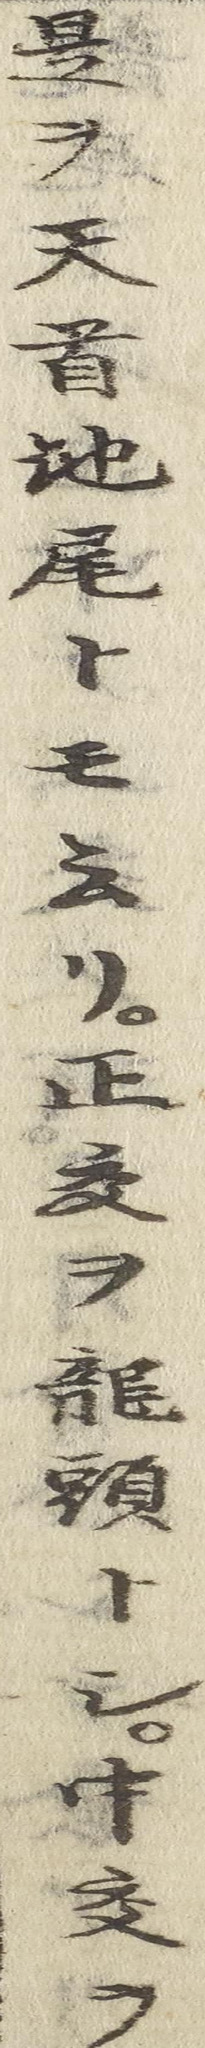是ヲ天首地尾トモ云リ。正交ヲ龍頭トシ。中交ヲ

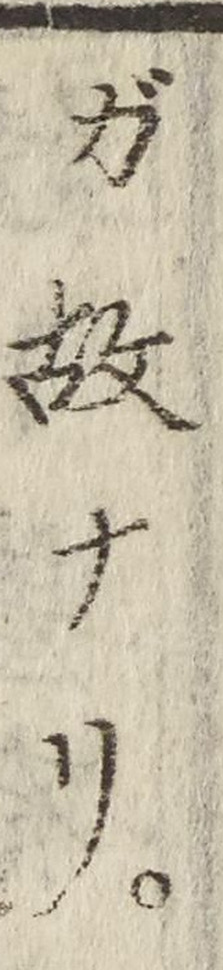ガ故ナリ。
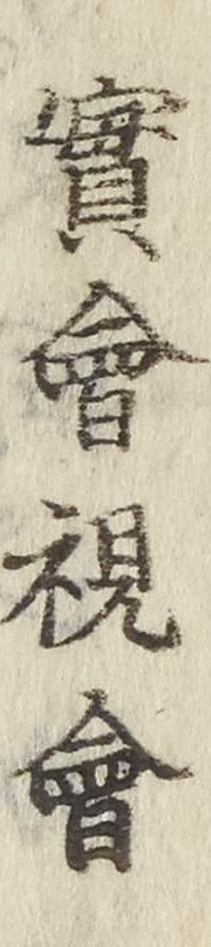実会視会
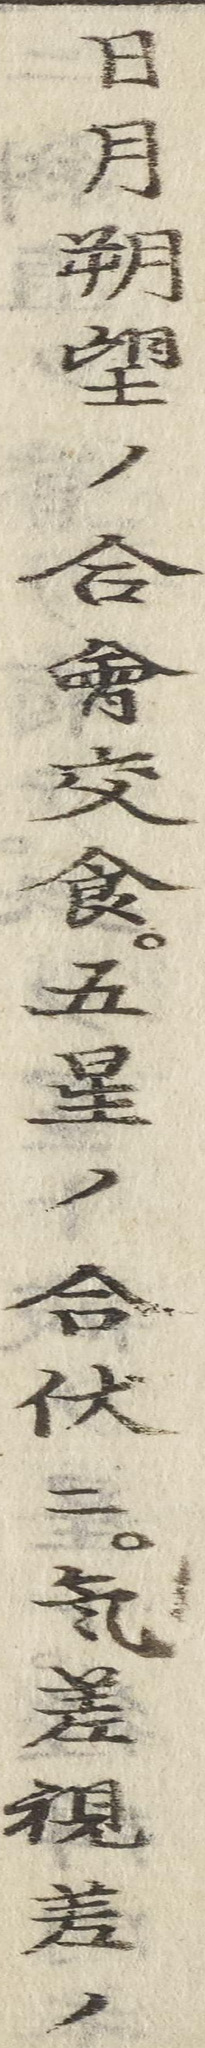日月朔望ノ合会交食。五星ノ合伏ニ。気差視差ノ
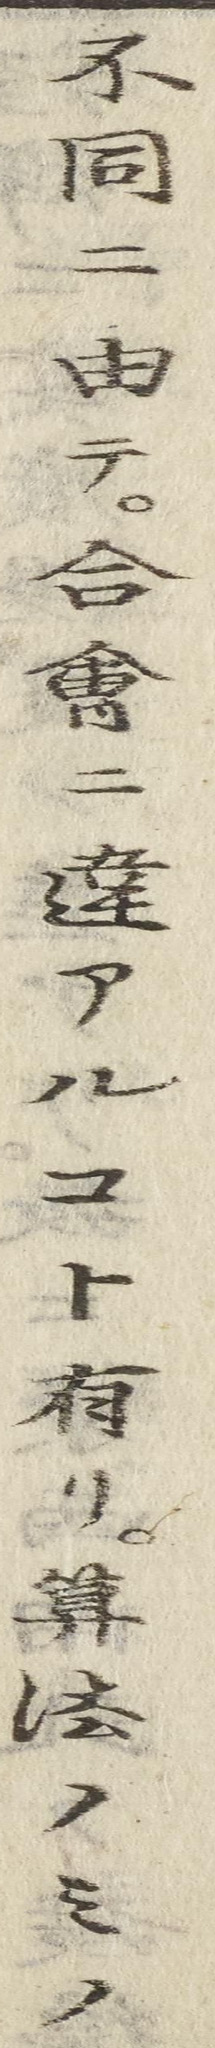不同ニ由テ。合会ニ達アルコト有リ。算法ノミノ
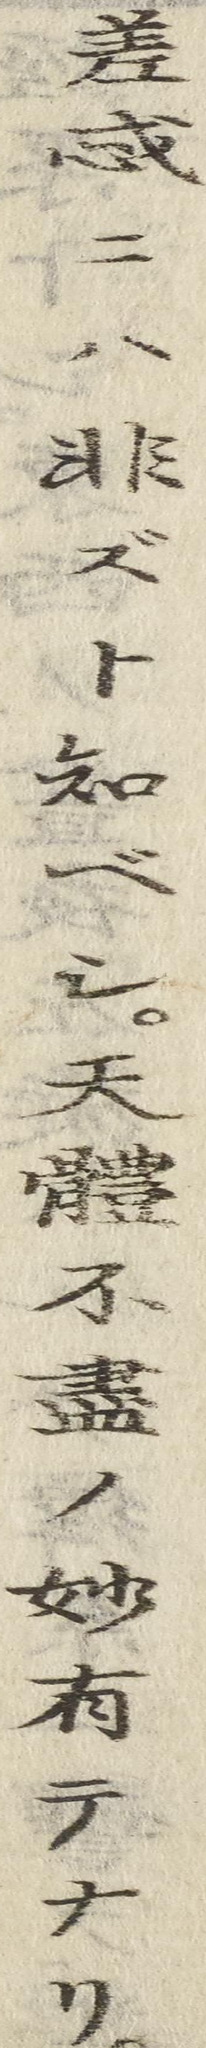差惑ニハ非ズト知ベシ。天体不尽ノ妙有テナリ。
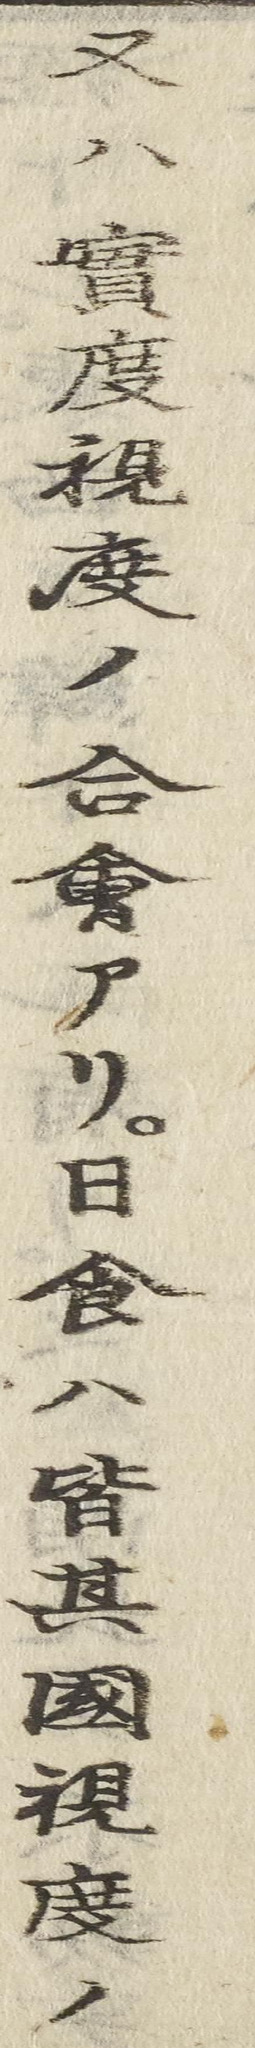又ハ実度視度ノ合会アリ。日食ハ皆其国視度ノ
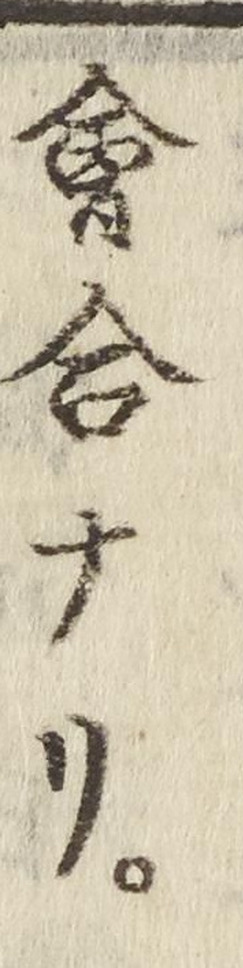会合ナリ。
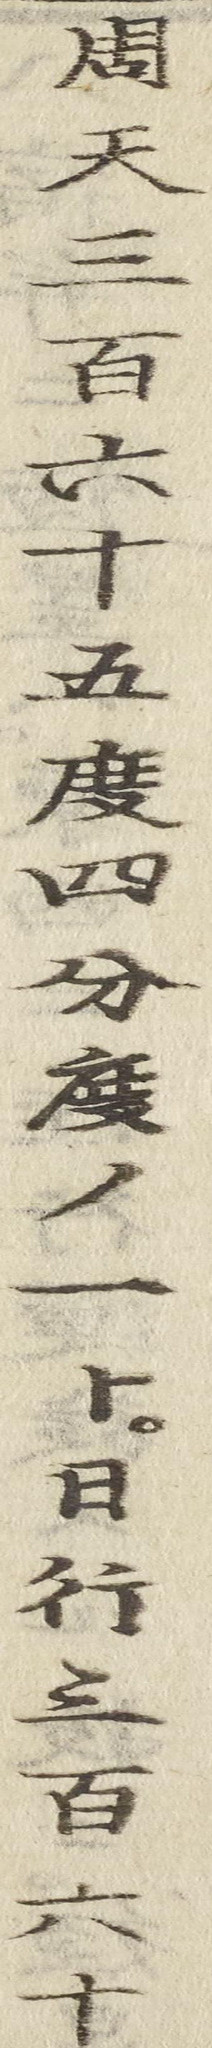周天三百六十五度四分度ノ一ト。日行三百六十
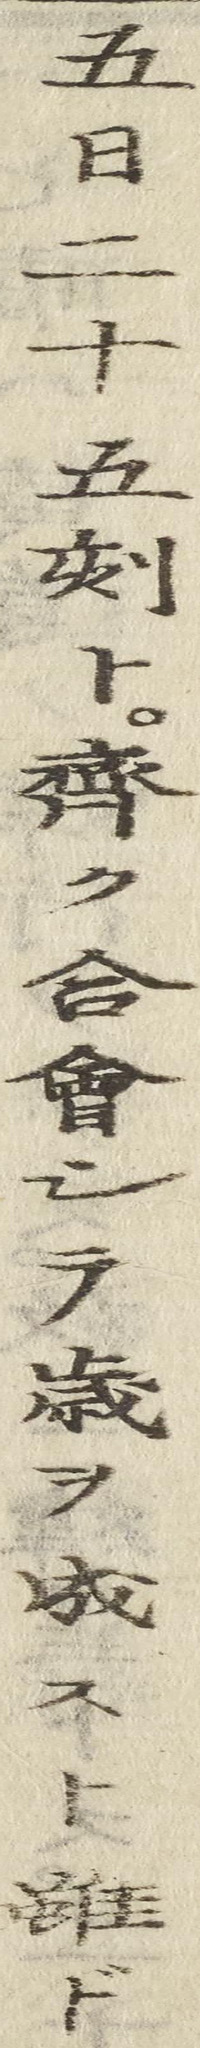五日二十五刻ト。斉ク合会シテ歳ヲ成スト雖ド
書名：大略天学名目鈔　天經或問附録
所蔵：東京大学地震研究所図書室 Earthquake Research Institute Library, The University of Tokyo, JAPAN
